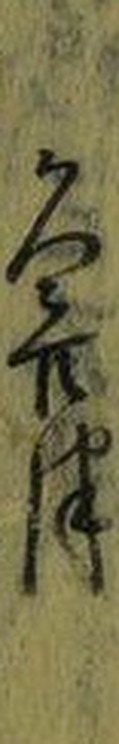久喜津
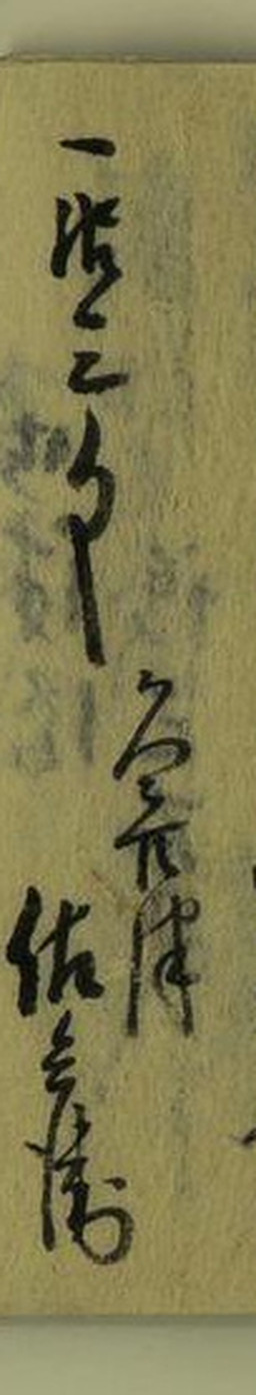一銀三匁佐兵衛
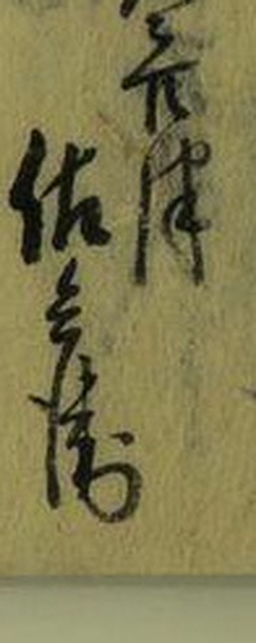弥兵衛
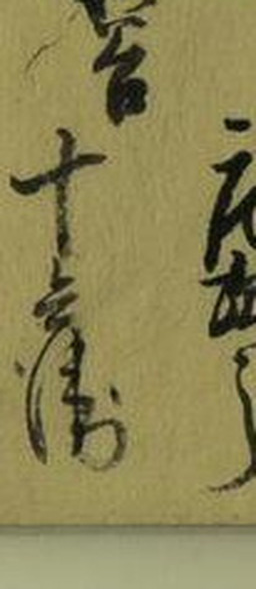弥兵衛

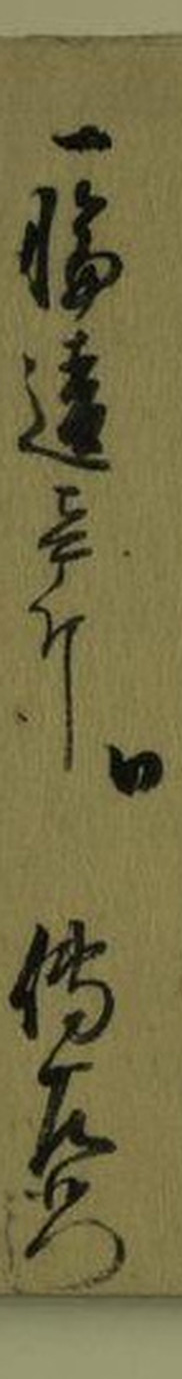一輪違壱斤伝左エ門
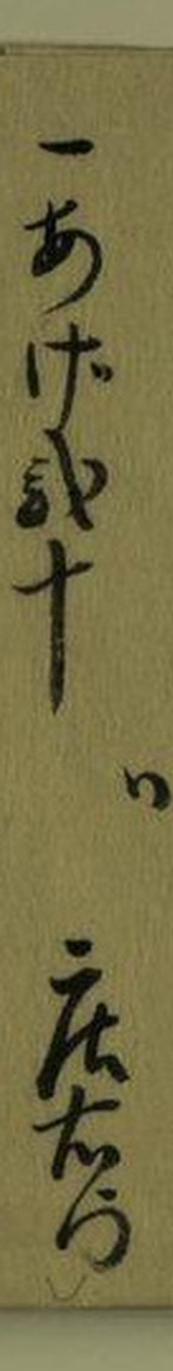一あげ弐十庄右衛門
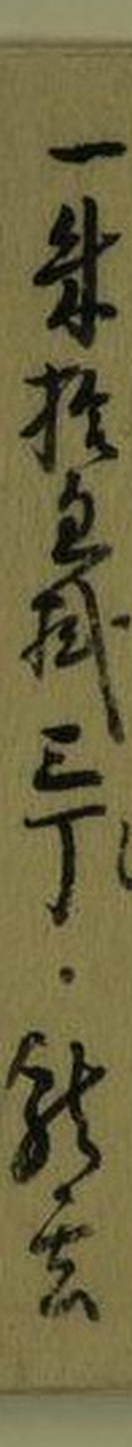一朱拾匁掛三丁龍玄
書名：（献立覚）
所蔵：福井県文書館 Fukui Prefectural Archives
